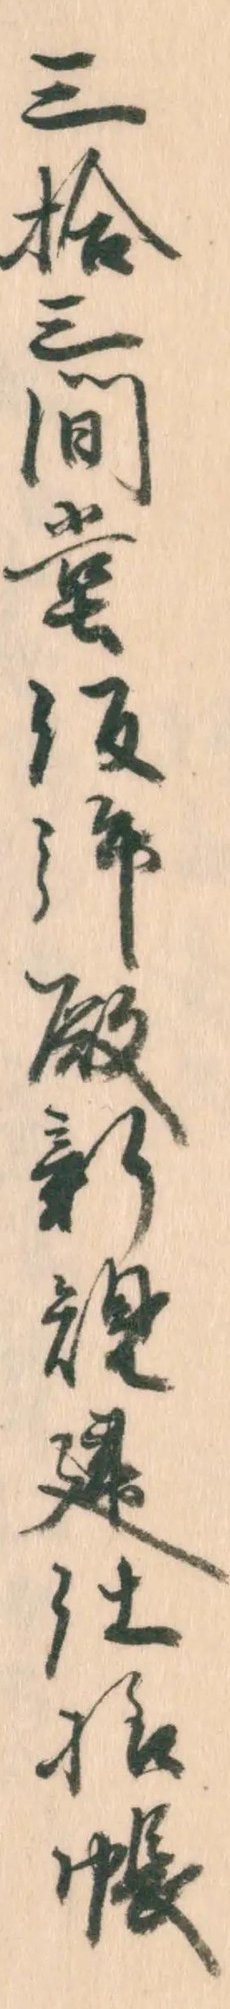三拾三間堂仮拝殿新規建仕様帳

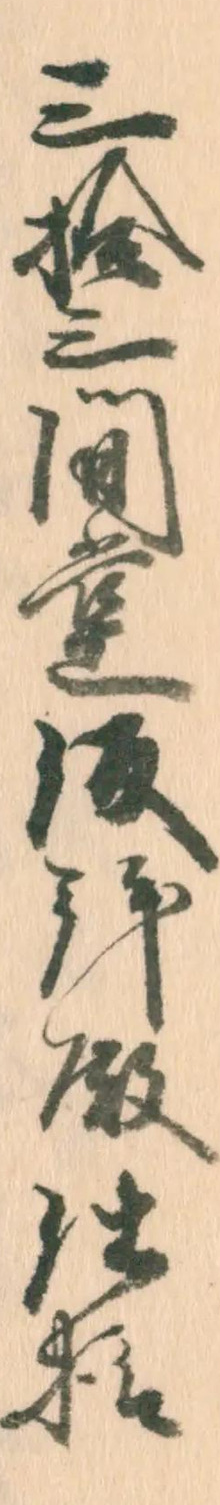三拾三間堂仮拝殿仕様
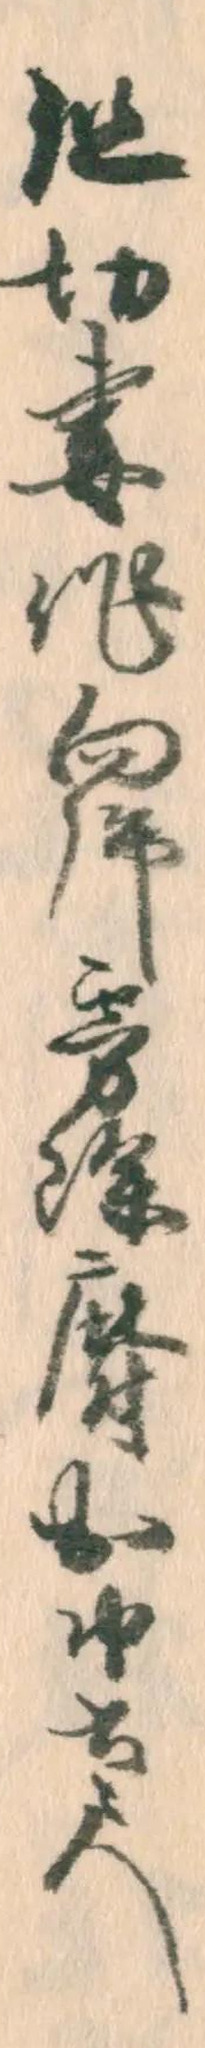但切妻作向拝霧除庇付出巾六尺
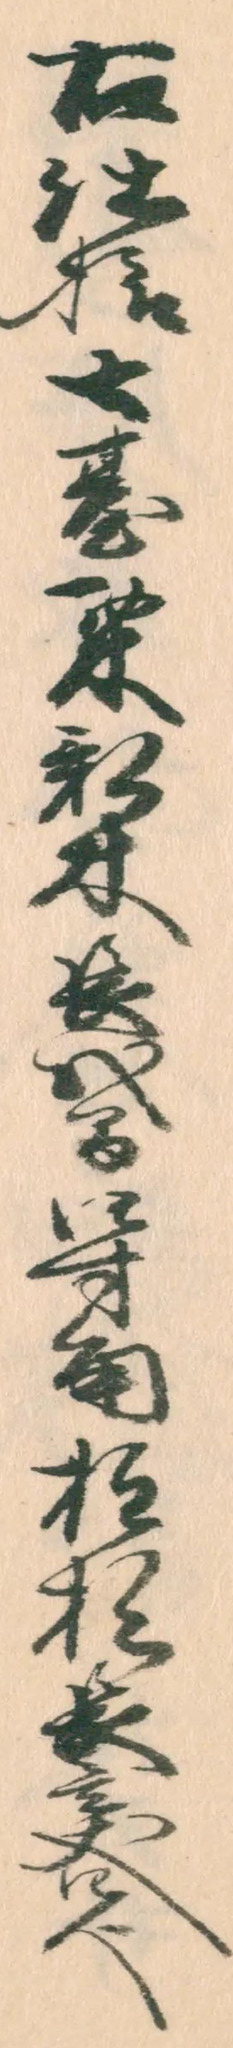右仕様土台栗新木長弐間四寸角柱松長壱丈四尺
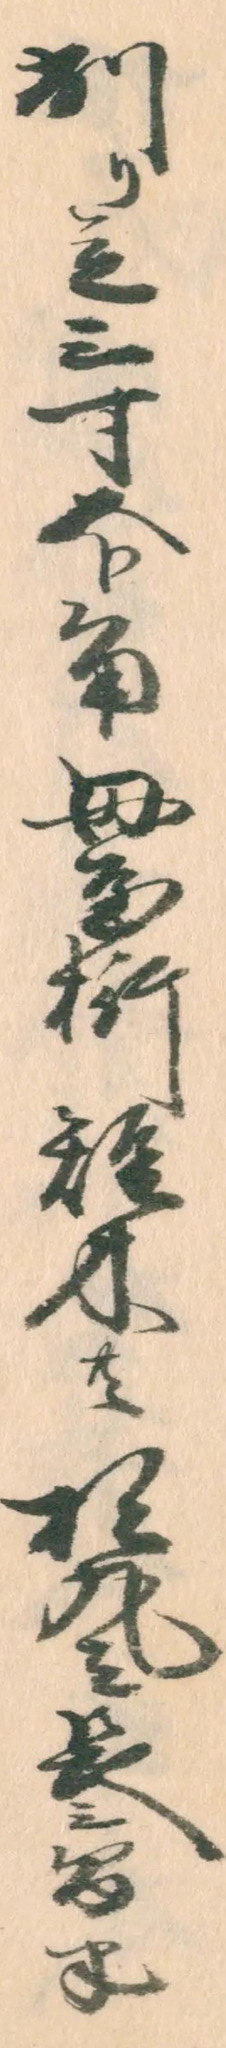削り立三寸五分角貫桁短木共松丸太長三間半
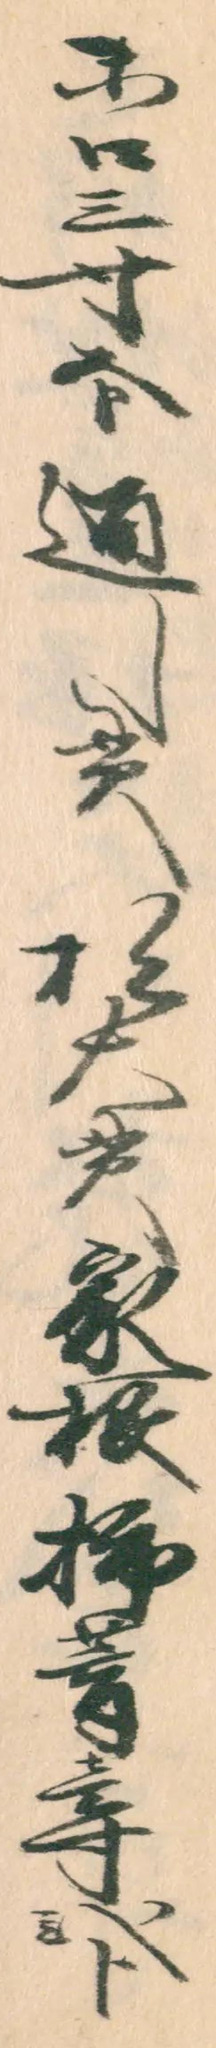末口三寸五分通し貫松大貫家根杮葺壱寸弐分

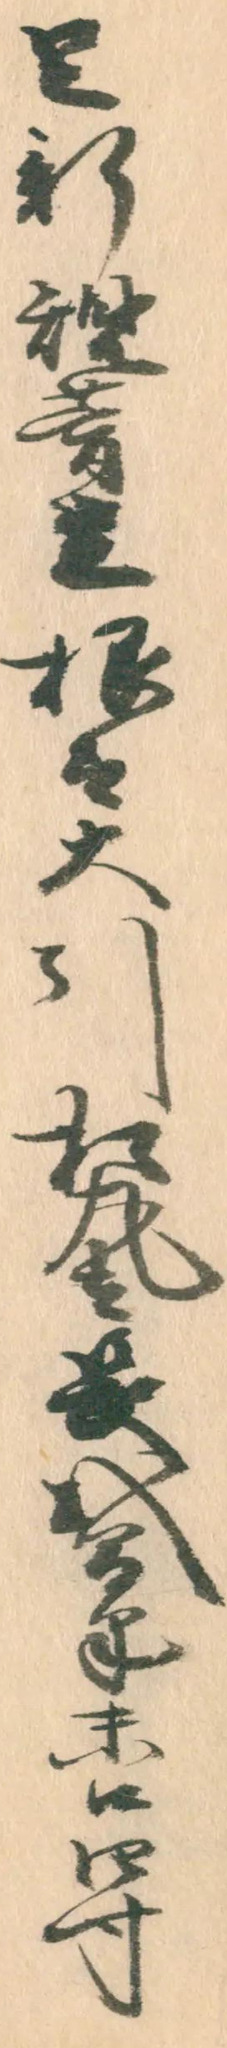足新規葺立根太大引松丸太長弐間半末口四寸
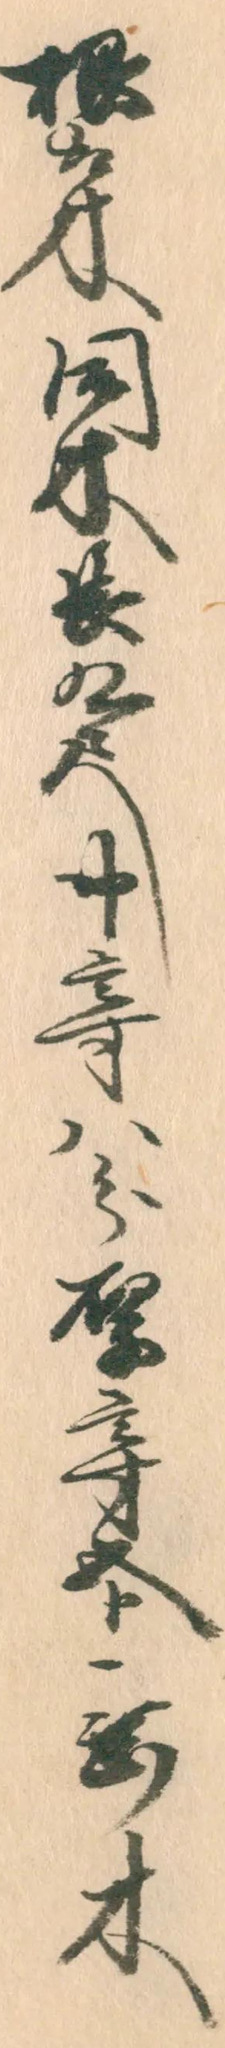根太木同木長九尺巾壱寸八分厚壱寸五分一垂木
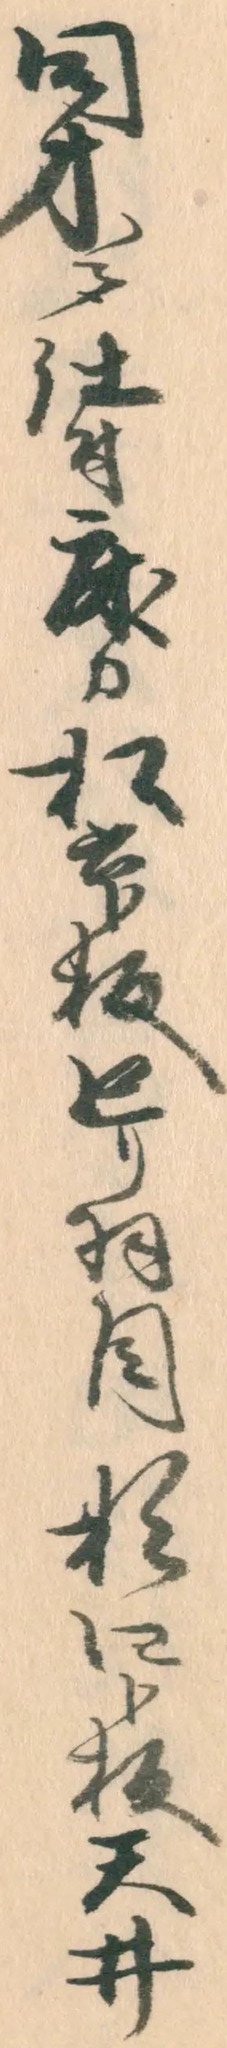同木ニ〆仕付床カ松六分板廻り羽目松四分板天井
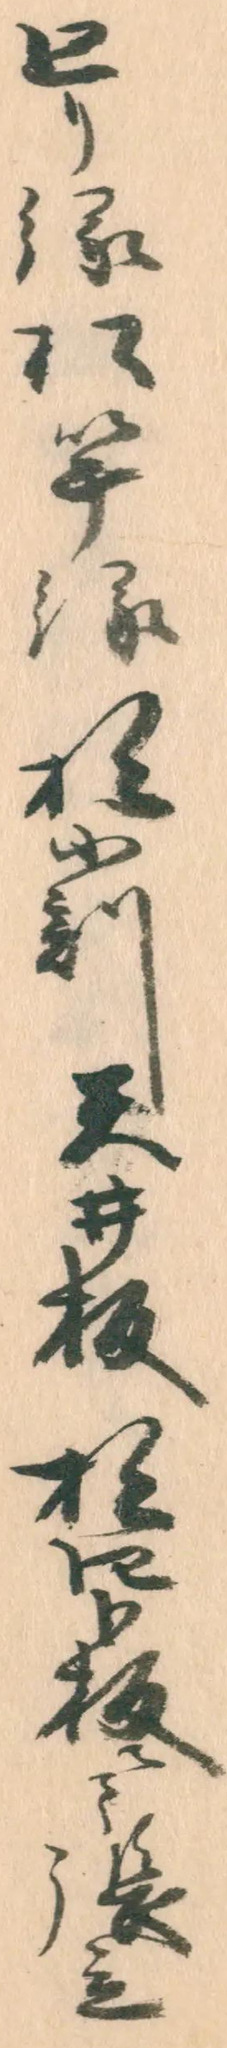廻縁松竿縁松小割天井板松四分板ニて張立
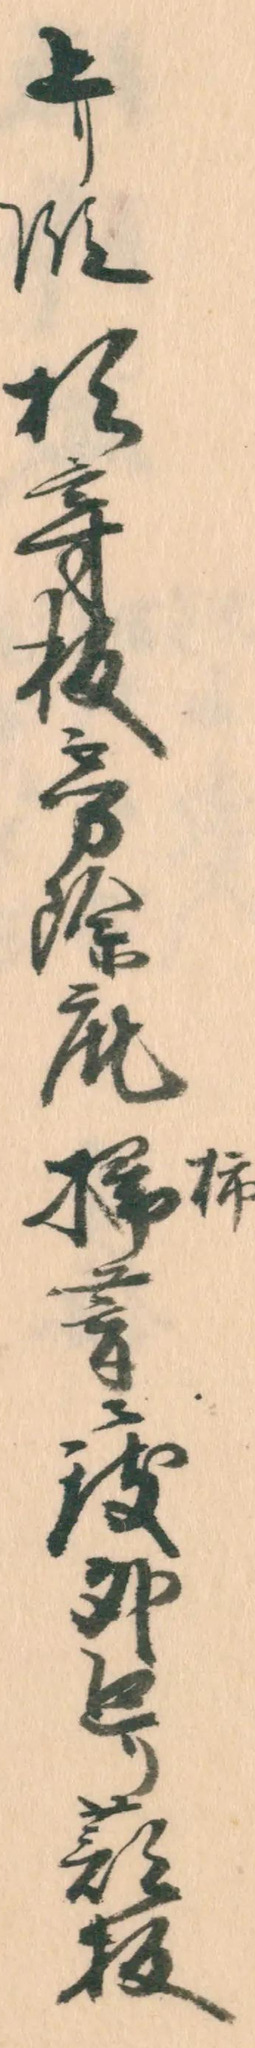上り段松壱寸板霧除庇杮葺ニ致外廻り蔀板
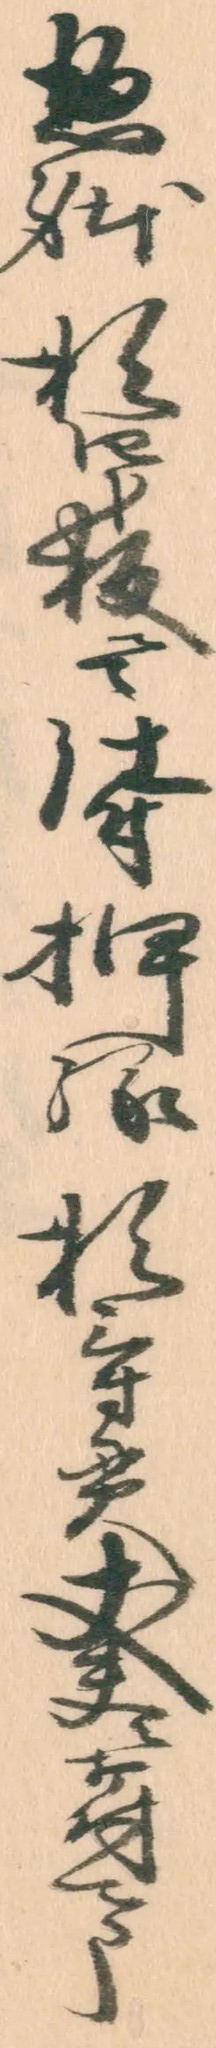惣体松四分板ニて仕付押縁松三寸貫丈夫ニ打付可申
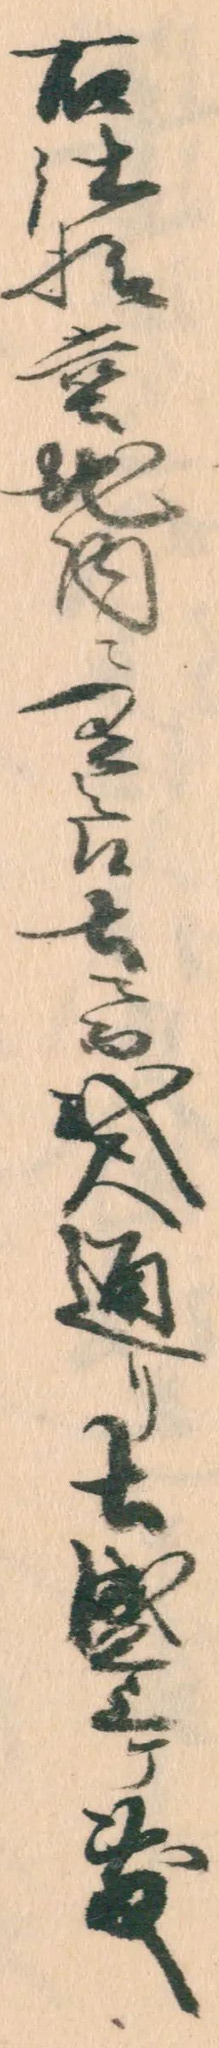右仕様堂地内ニ有之候土ニて弐尺通り土盛上ケ敷
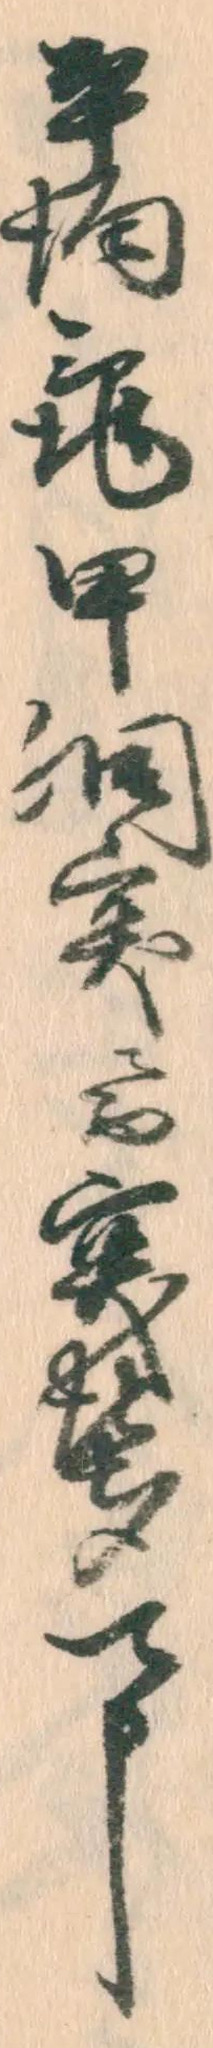平均亀甲胴付ニて突堅メ可申
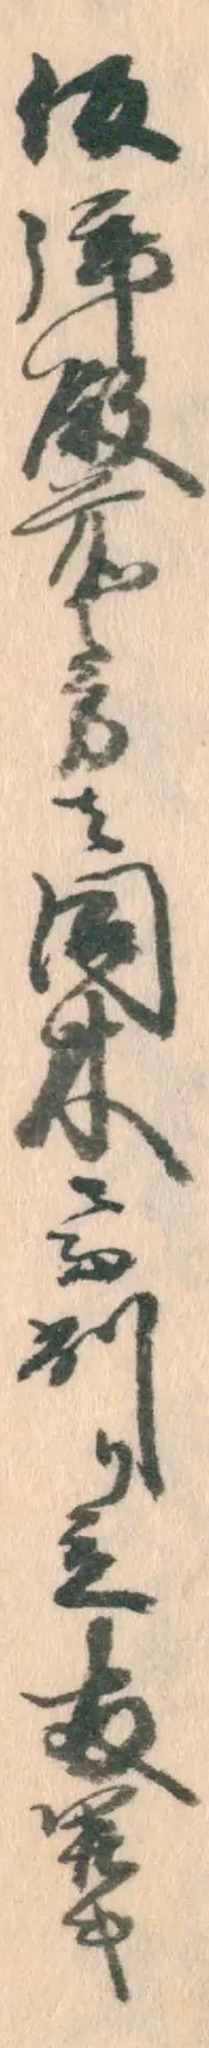仮拝殿前之方は同木ニて削り立両開キ
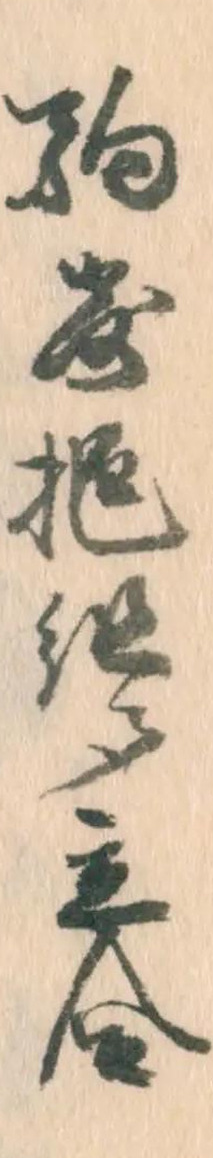駒寄框組ニ〆立合
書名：三十三間堂. [2]
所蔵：国立国会図書館 National Diet Library, JAPAN
